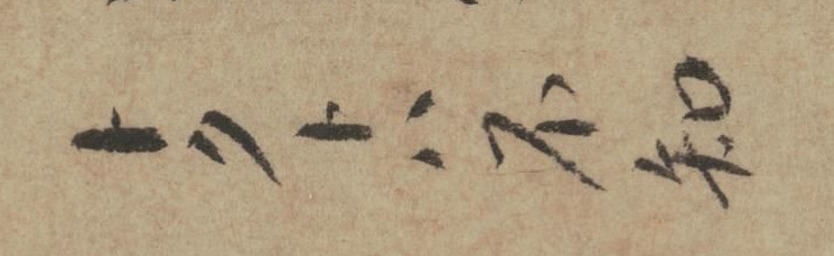トクトハ不知
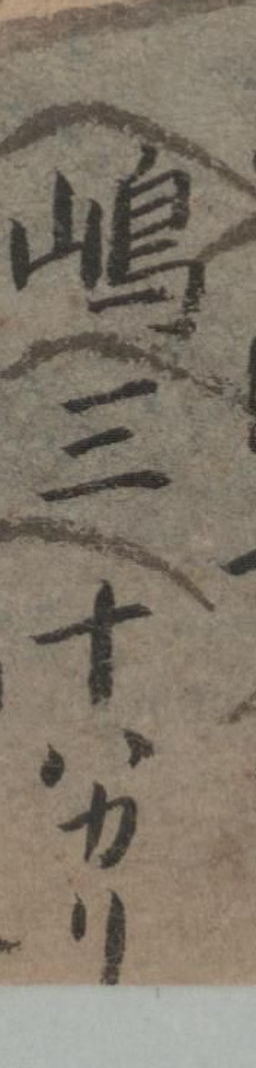嶋三十ハカリ
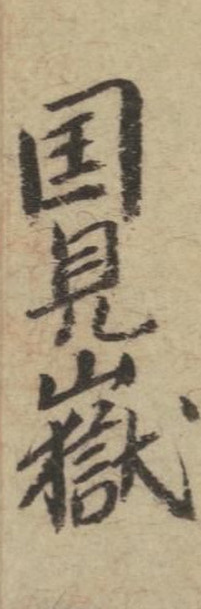国見嶽
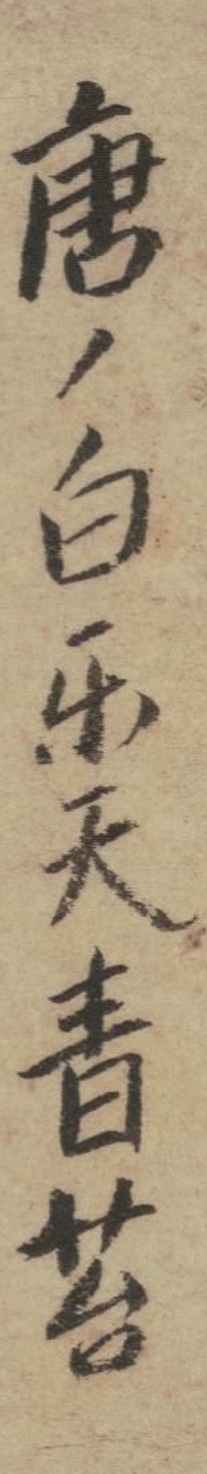唐ノ白楽天青苔
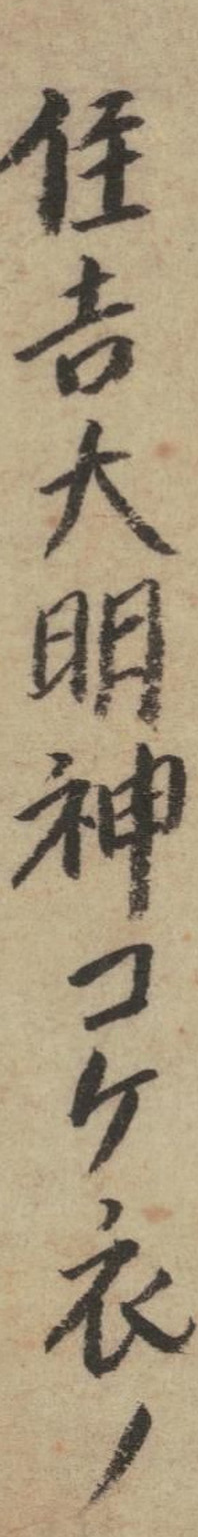住吉大明神コケ衣ノ
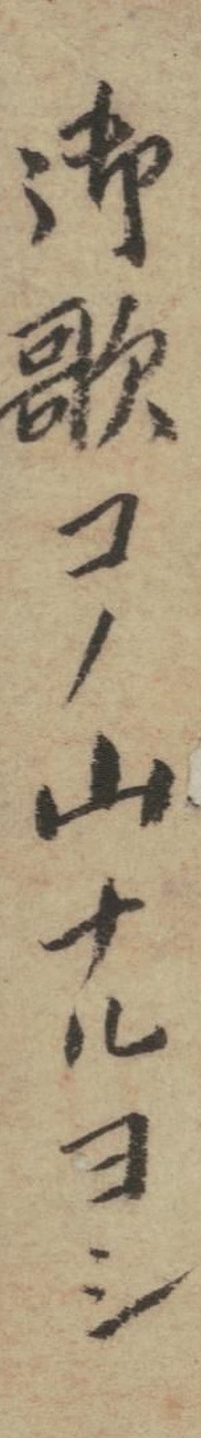御歌コノ山ナルヨシ
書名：寛政四子年肥前国嶋原山々燃崩城下町々村々破損ノ圖
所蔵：東京大学地震研究所図書室 Earthquake Research Institute Library, The University of Tokyo, JAPAN
